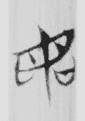{母口}
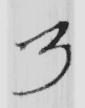乃
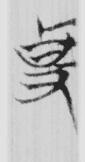史
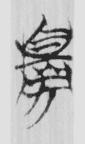臱
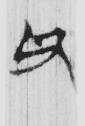父
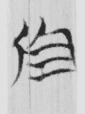於
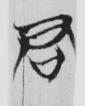君
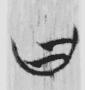曰
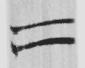二
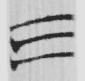三
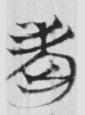老
